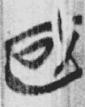或
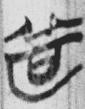甚
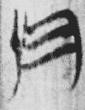於
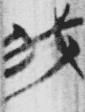我
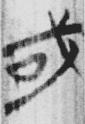或
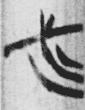必
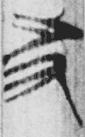寺（待）
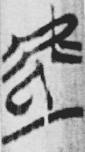○（乎）
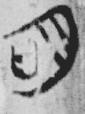名
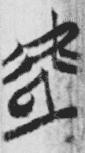○（乎）
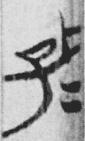孔子
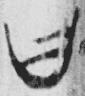曰
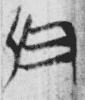於（烏）
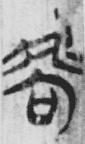唬（乎）
